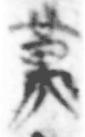黃
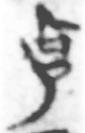克
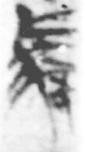馭（御）
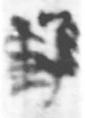○（椎）
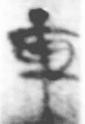車
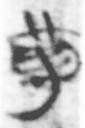革
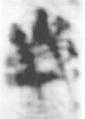兼
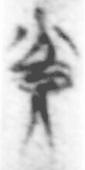貧（紛）
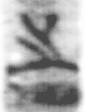之
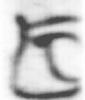○（圓）
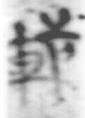軒
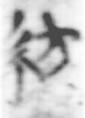紡
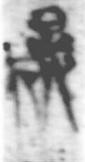○（表）
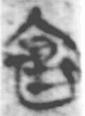裏
